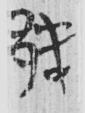邦
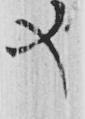又（有）
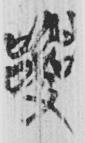○（亂）
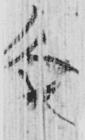師
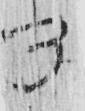乃
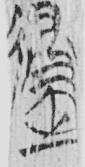○（歸）
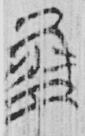雩（雨）
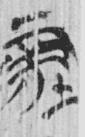塝（旁）
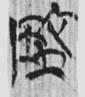地
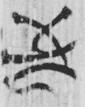至
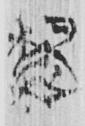○（漆）
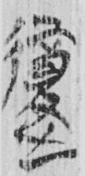○（復）
